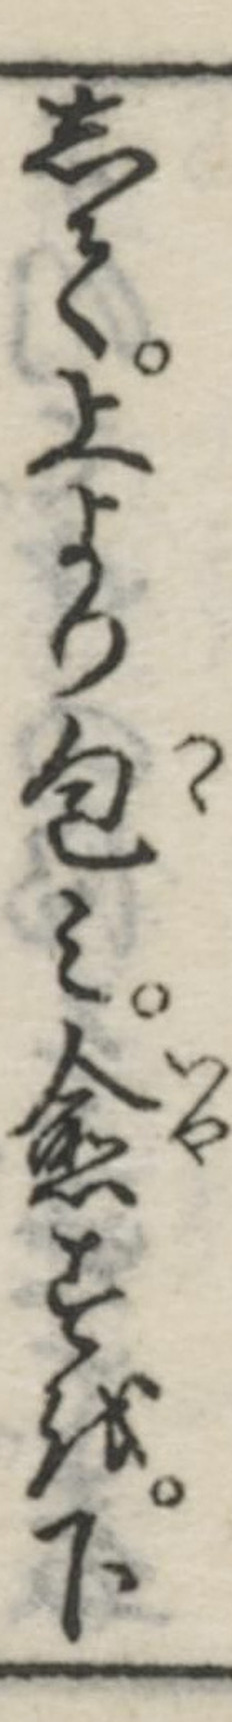して。上より包み。癒すを。下
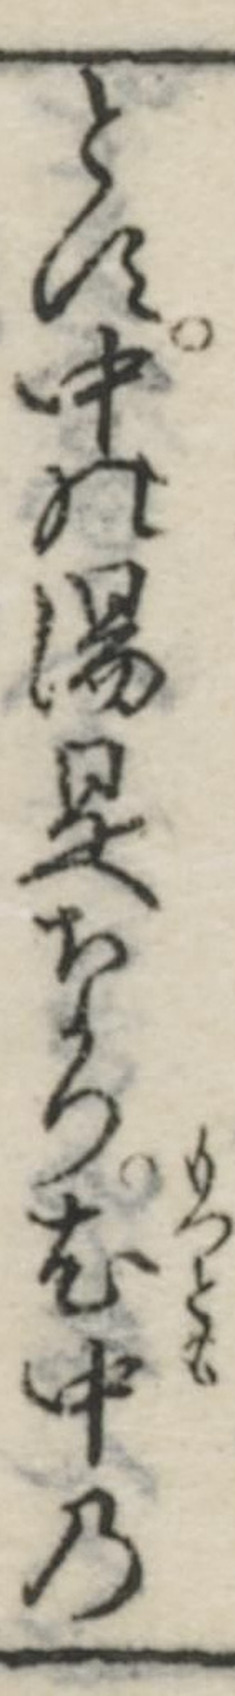とす。中の湯是なり。尤中の
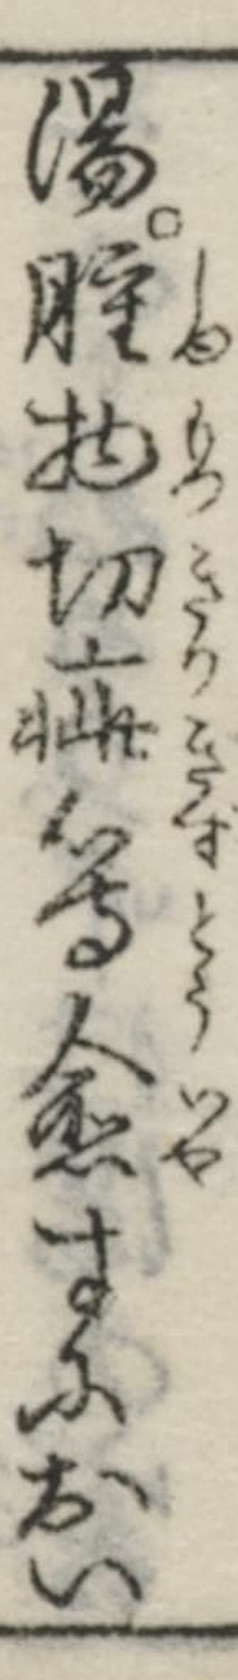湯。腫物切疵等癒すにおい
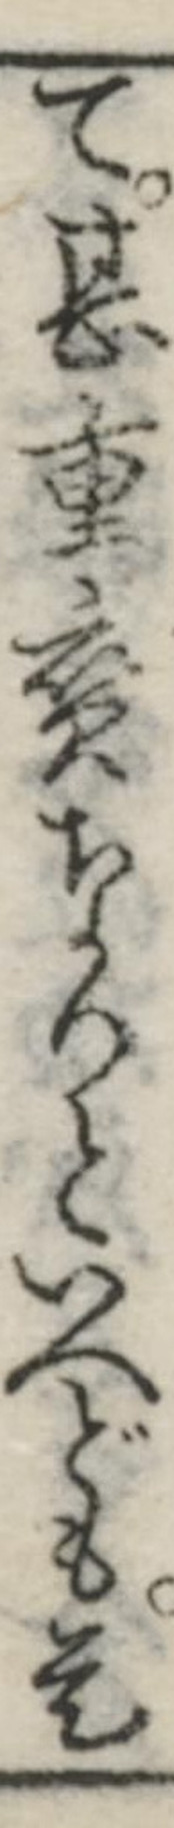て。甚重宝なりといへども。是
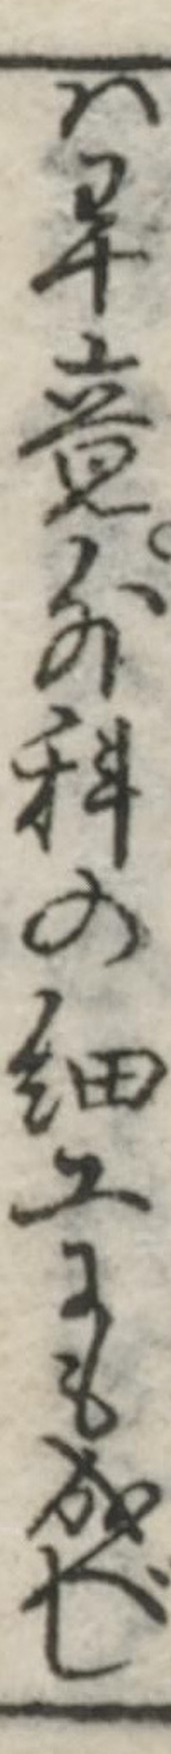は畢竟。外科の細工にも成べし。
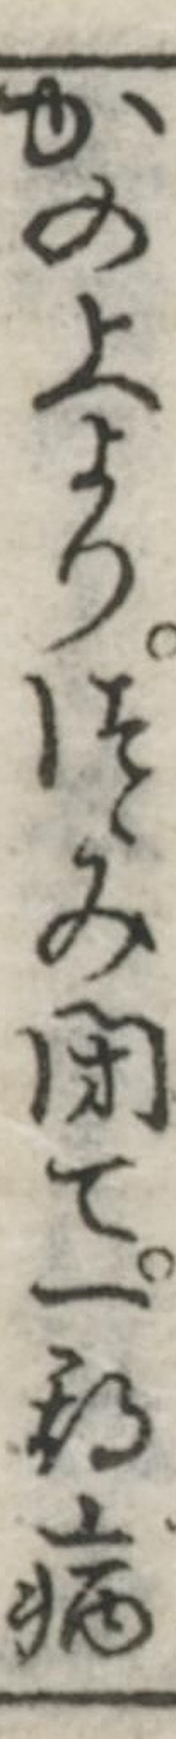かの上より。つゝみ閉て。一期病
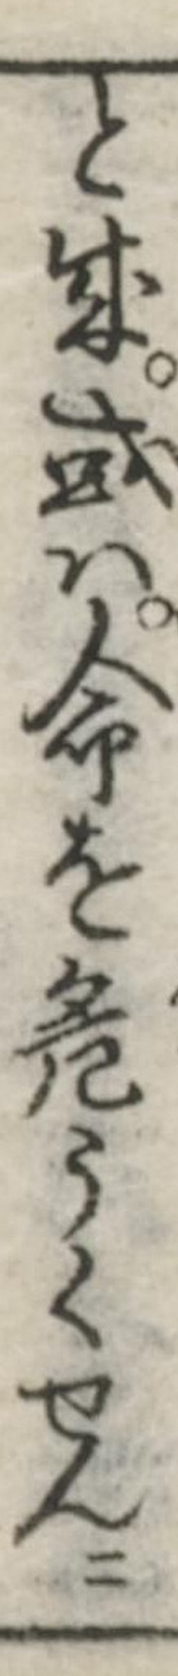と成。或は。命を危うくせんに
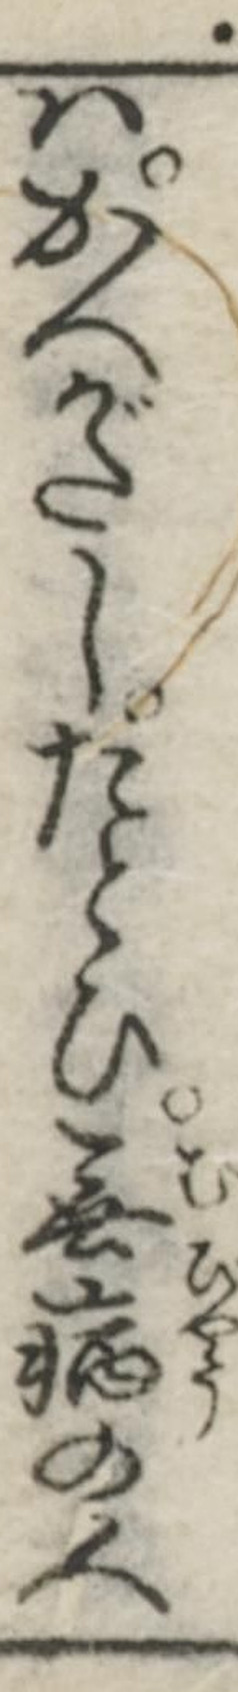は。かへがたし。たとひ。無病の人
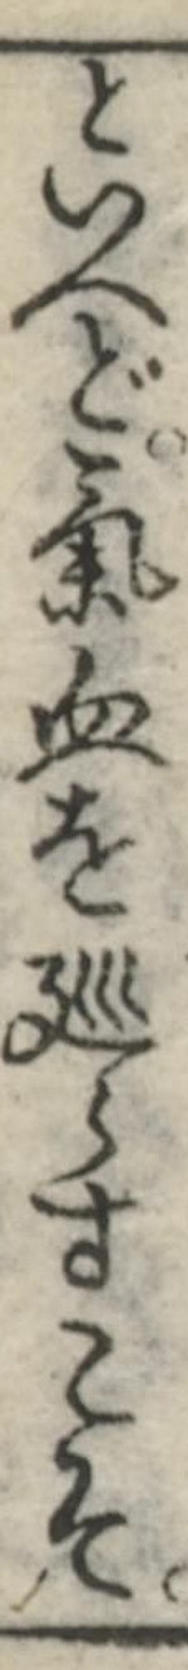といへど。気血を巡らすこそ。

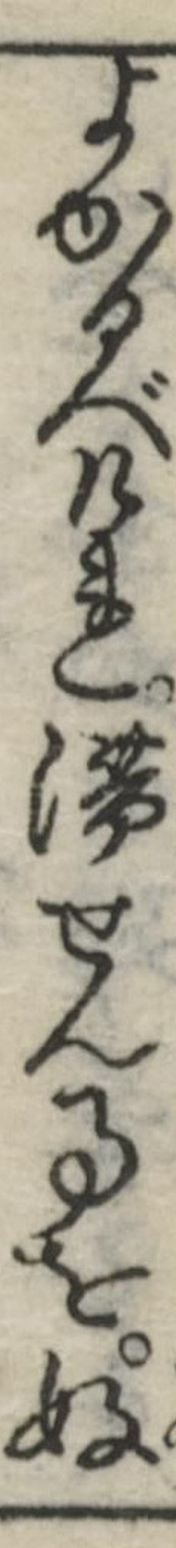よかるべけれ。滞せん事を。好
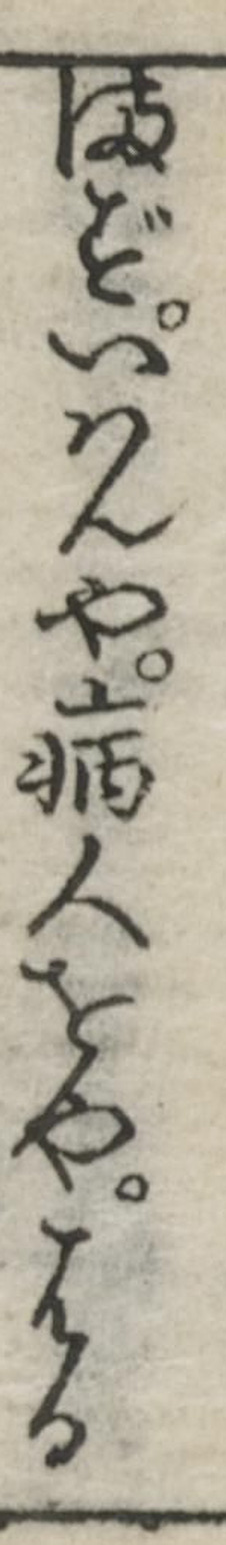まず。いはんや。病人をや。はる
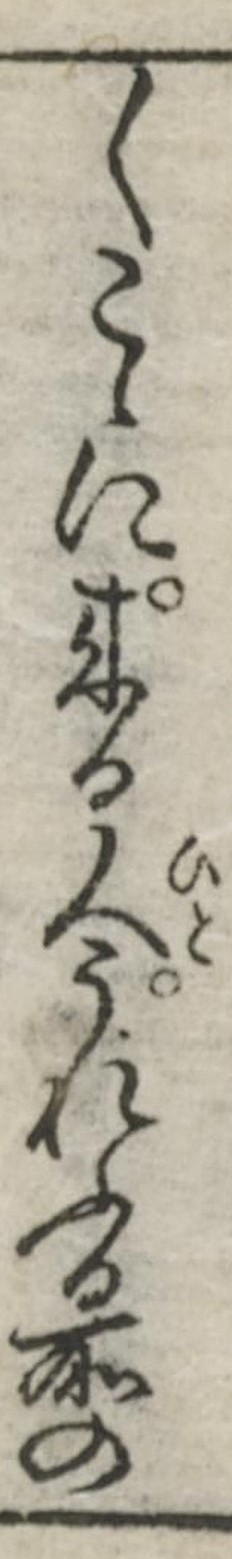〳〵こゝに。来る人。うれふる所の
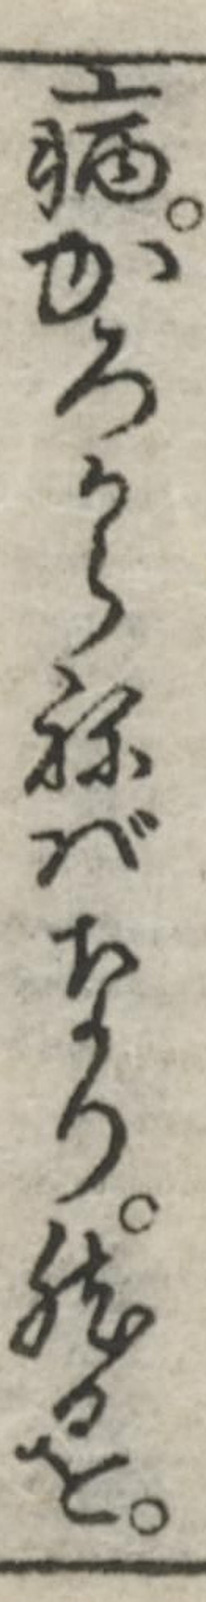病。かろからねばなり。然るを。
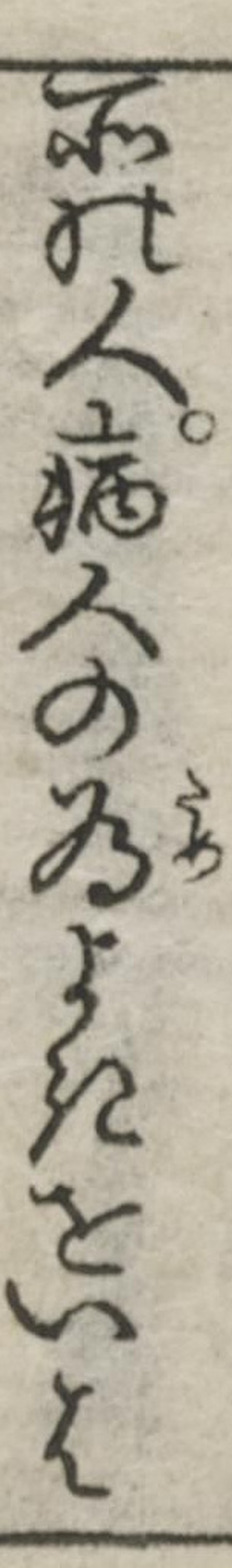所の人。病人の為よきをいは
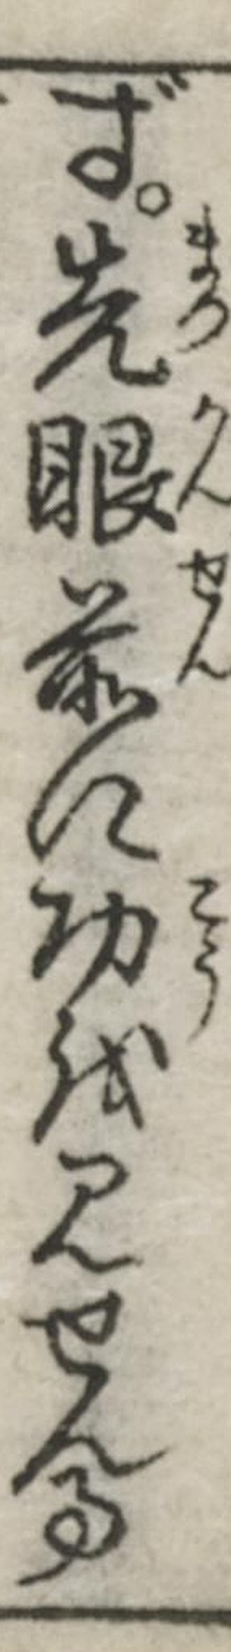ず。先眼前に功を見せん事
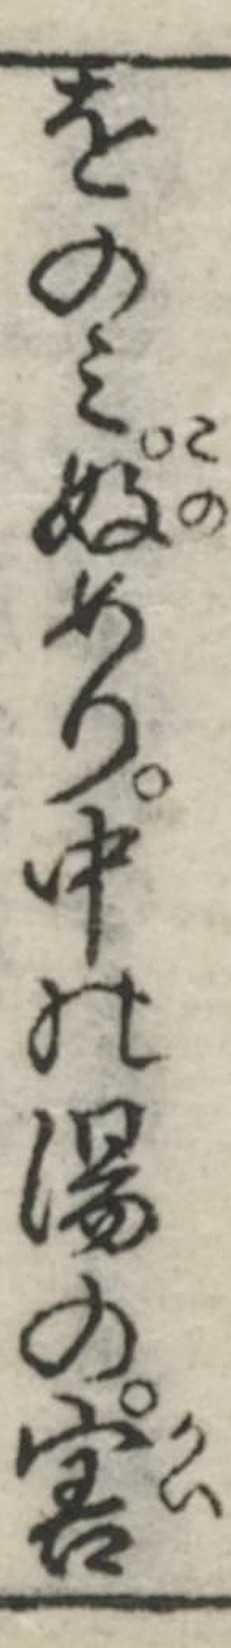をのみ。好めり。中の湯の。害
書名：但州城崎浴湯辧
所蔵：東京大学地震研究所図書室 Earthquake Research Institute Library, The University of Tokyo, JAPAN
